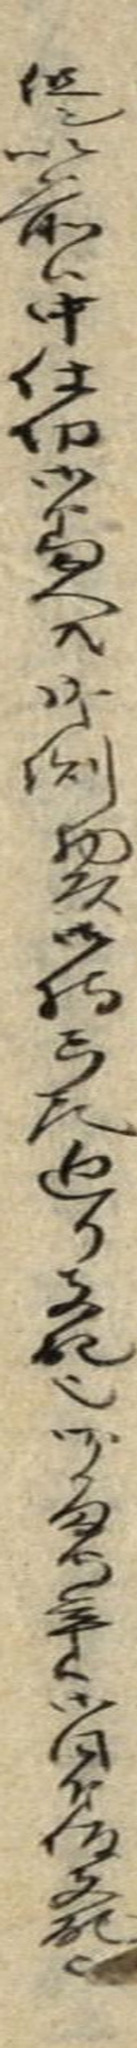但し以前は中仕切御番人共御側物頭御持弓頭廻り支配也御留守年は御目付仮支配也
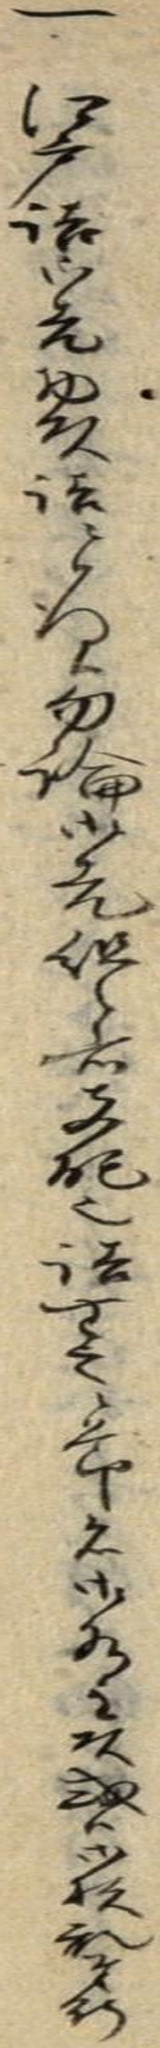一江戸詰御先物頭詰に候得は勿論御先組之者支配也詰無之候節は御水主頭或は御杉形奉行

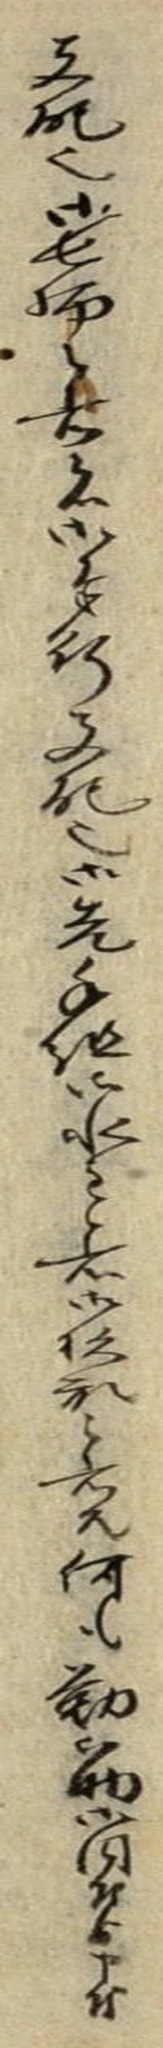支配也御長柄之者は御奉行支配也御先手組に水主之者御杉形之者共何も勤筋御目付ゟ申付
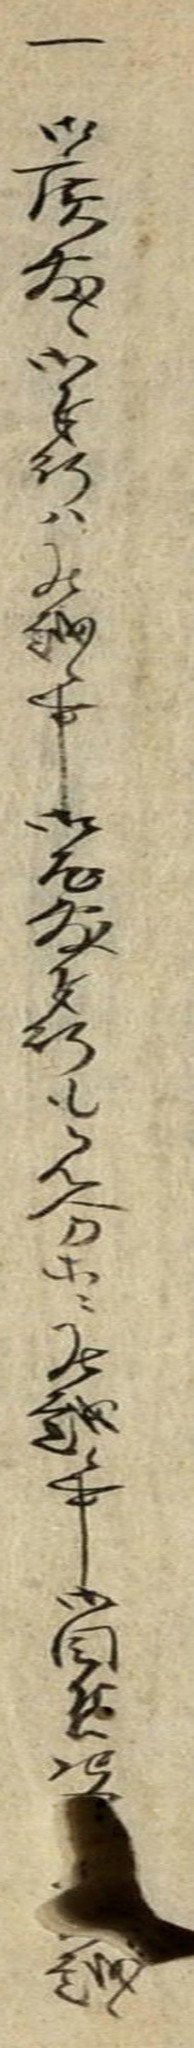一御広敷へ御奉行は罷越候事御屋敷奉行も見分等に罷越候事御目付は決越候
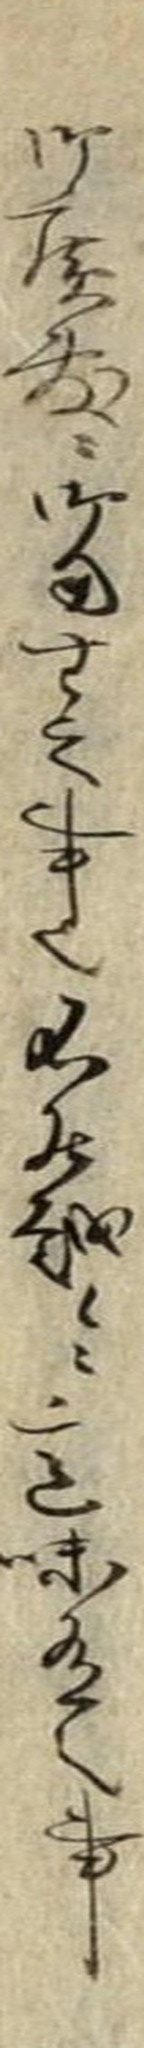御広敷に御用無之事也不罷越候に意味有之事
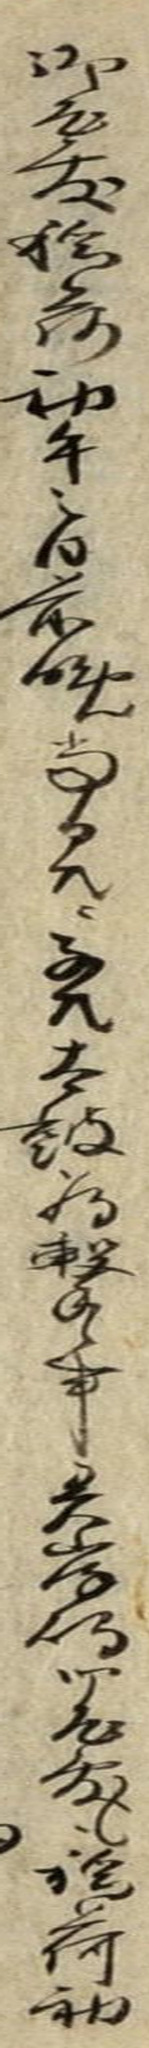一御屋敷稲荷初午之日前晩当日共に子共太皷為撃候事霊岸嶋御屋敷も稲荷初
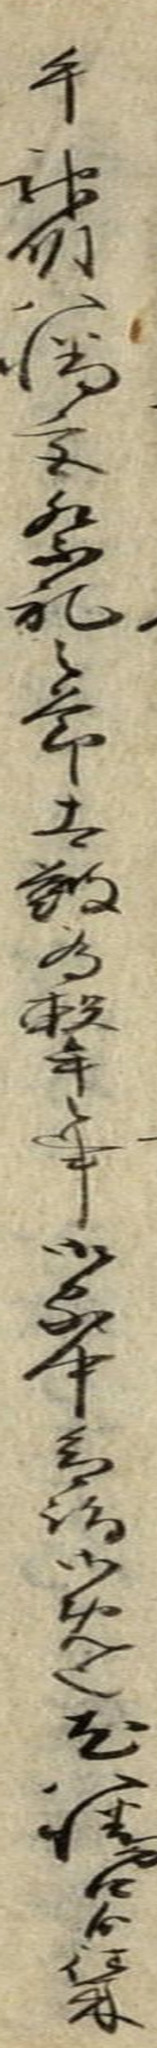午神明八幡宮祭礼之節太皷為撃候事御家中参詣御免也尤八幡口ゟ往来
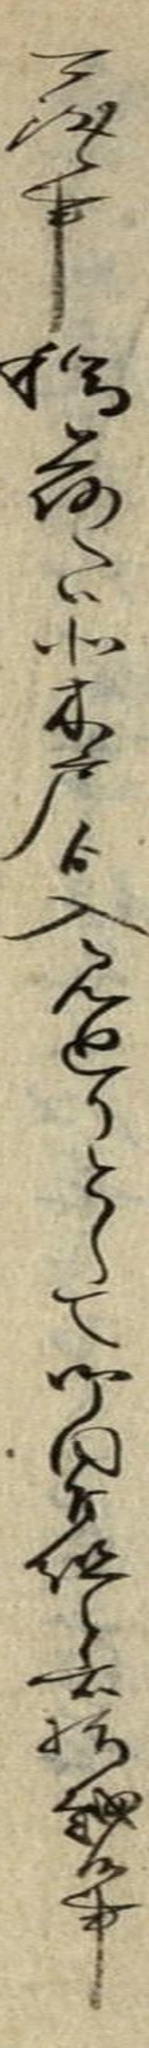可致候事稲荷へは北木戸ゟ入見廻りとして御目付組之者指越候事
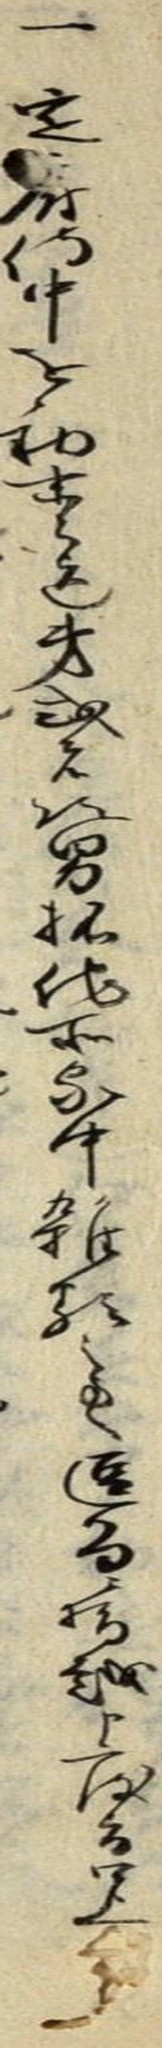一定府侍中を初末々迄弟或は次男等他所家中雑類之方へ逗留に指越申度旨口上
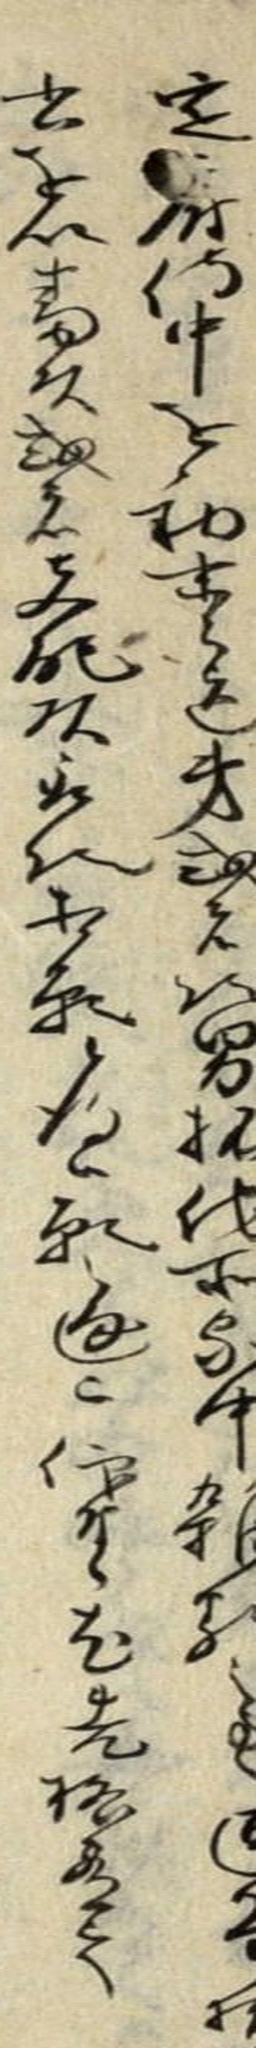書を以番頭或は支配頭取次相願候得は願之通被仰付候尤先格有之
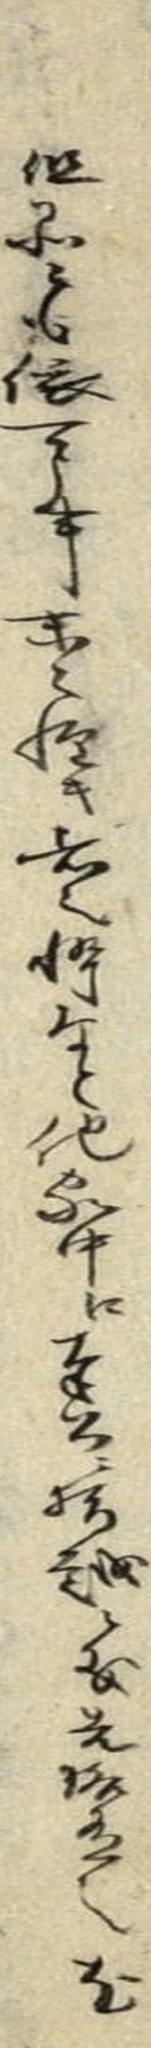但品にも依可申事末々軽き者之忰なと他家中江奉公に指越候義先格有之尤
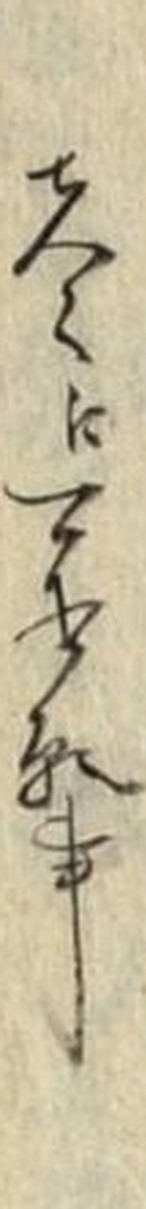夫々江可相願事
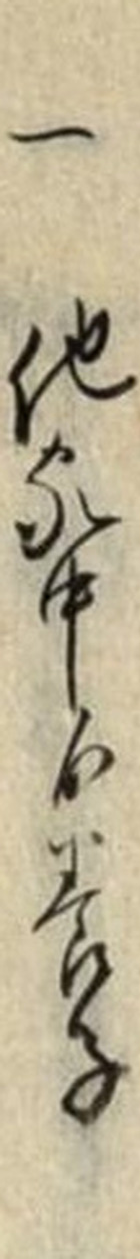一他家中ゟ養子
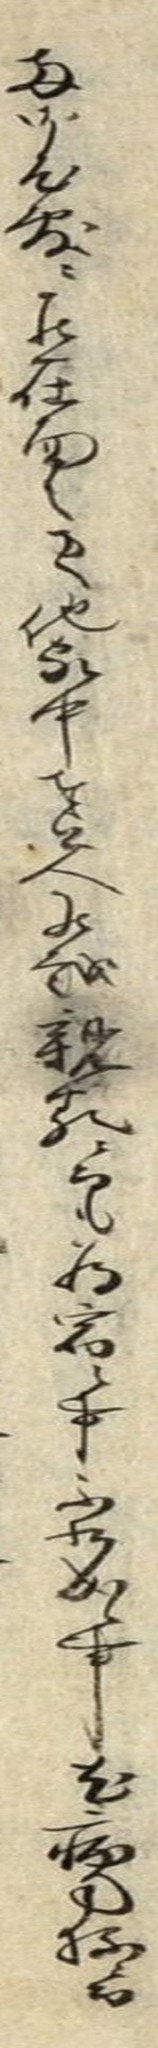一両御屋敷に罷在面々方へ他家中奉公人罷越親類にても為宿候事不相成候事尤病用抔にて
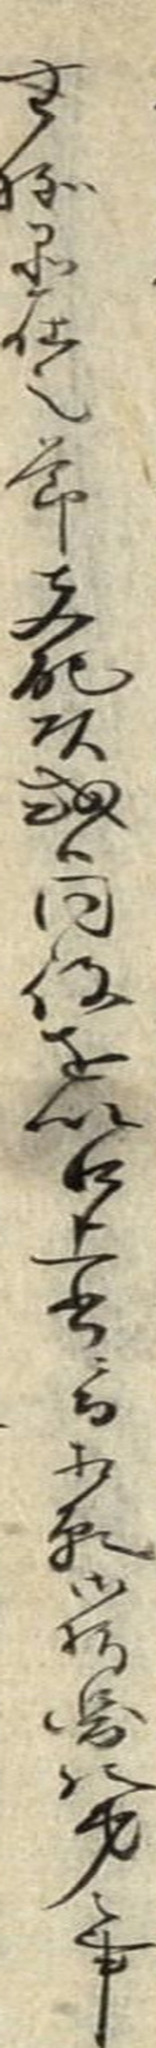無據品在之節支配頭或は同役を以口上書にて相願御指図次第之事
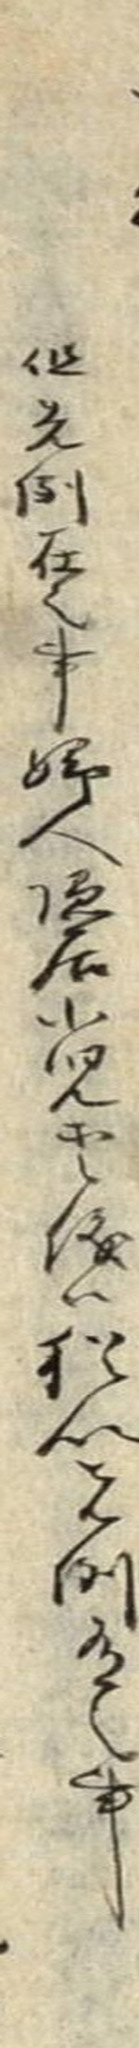但先例在之事婦人隠居小児等之儀は猶以先例有之事
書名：三都并道中之部
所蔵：福井県文書館 Fukui Prefectural Archives
